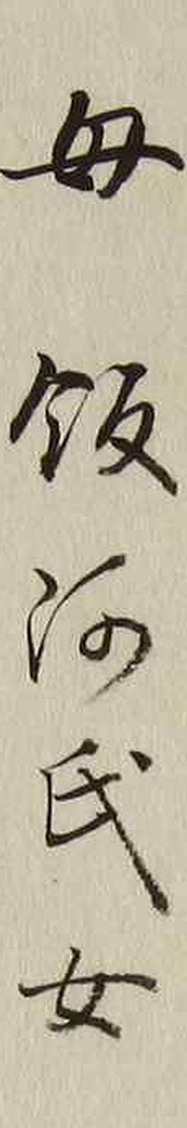母飯河氏女
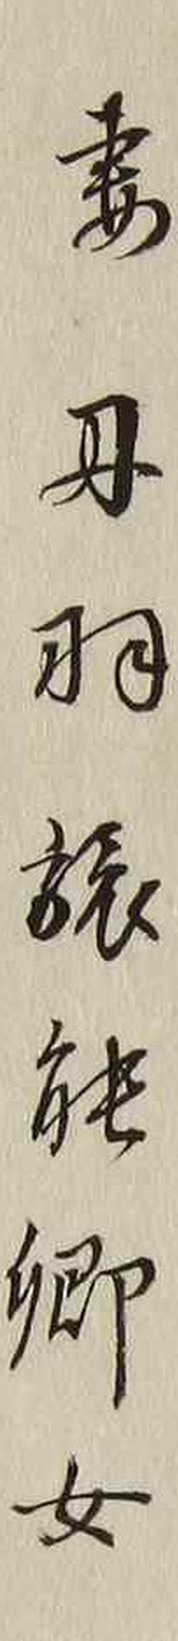妻丹羽旅能卿女
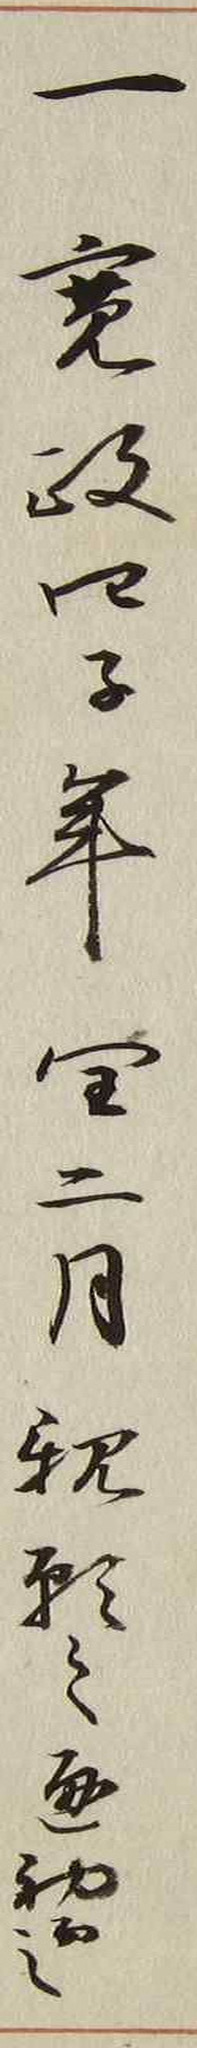一寛政四子年閏二月親願い之通初めて之
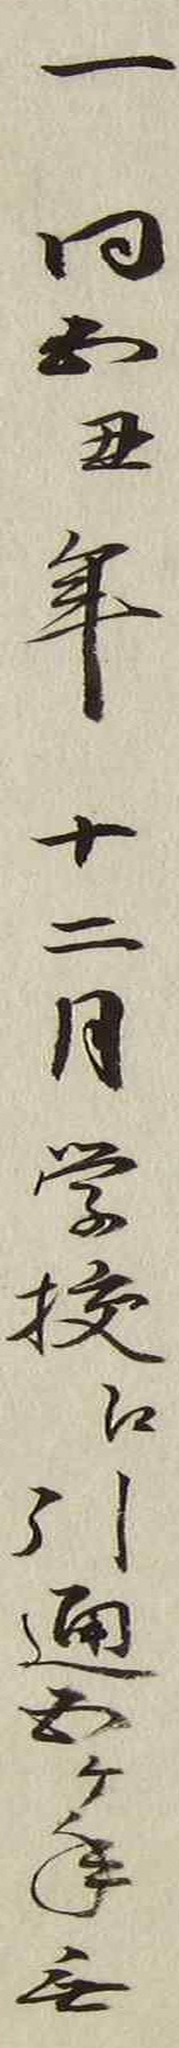一同五丑年十二月学校へ引き通り五ケ年

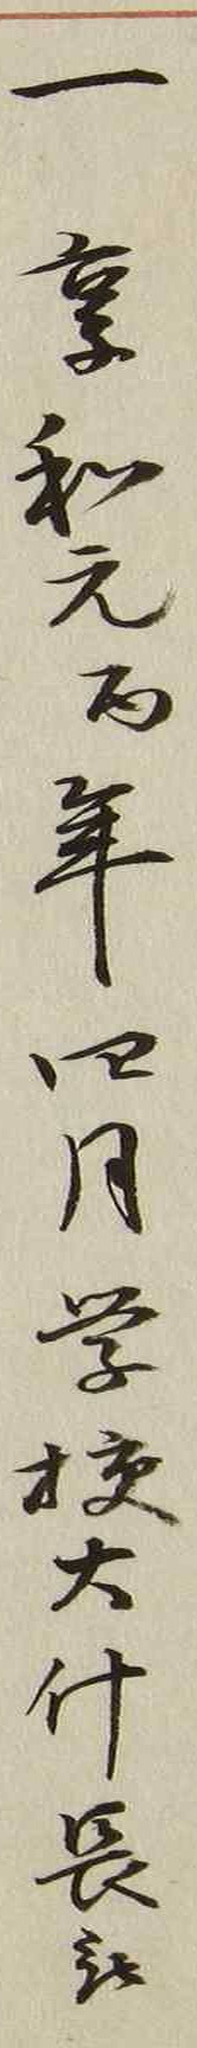一享和元酉年四月学校大什長
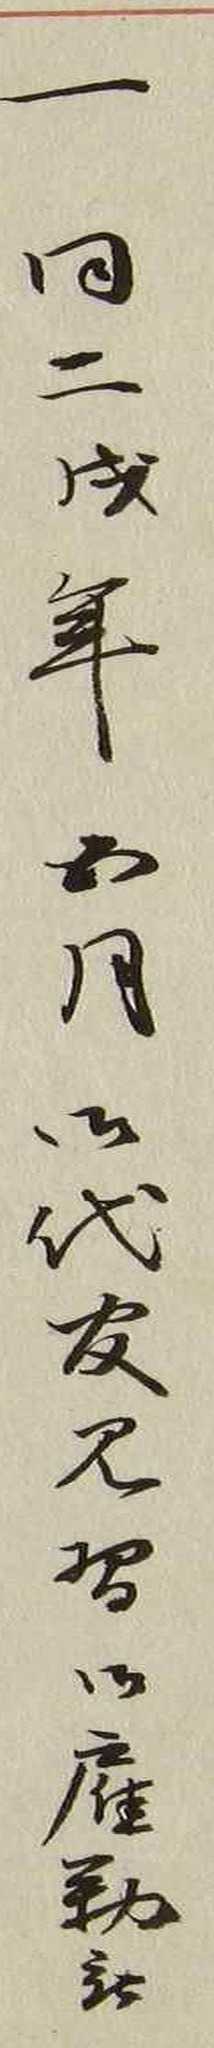一同二戌年五月御代官見習御雇い勤め
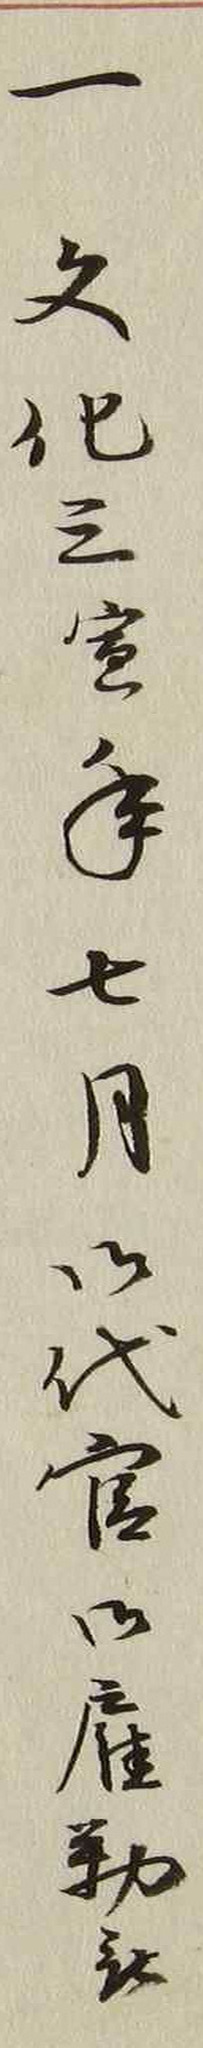一文化三寅年七月御代官御雇い勤め
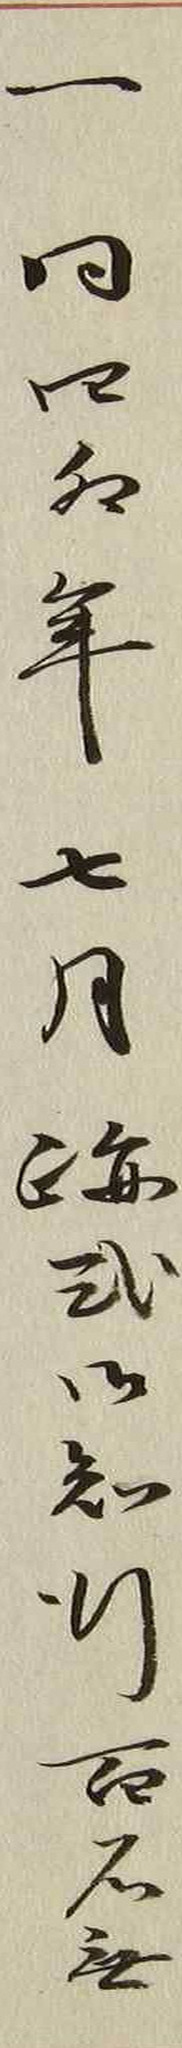一同四卯年七月跡式御知行百石
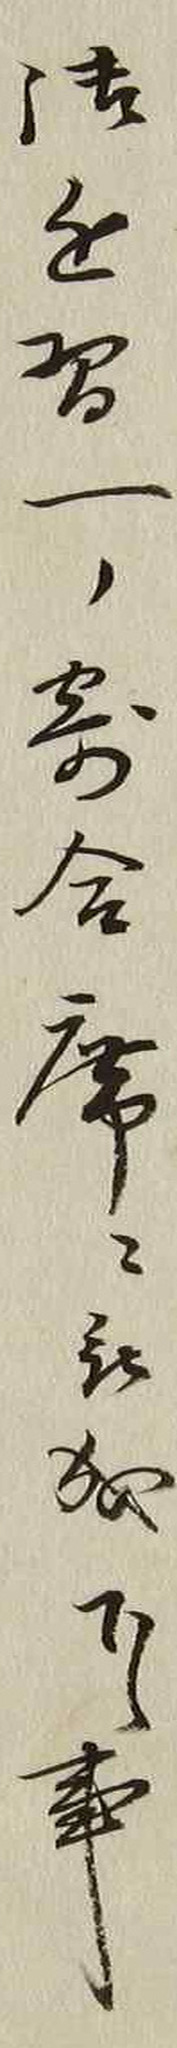御近習一ノ寄合席ニ成し下され候事
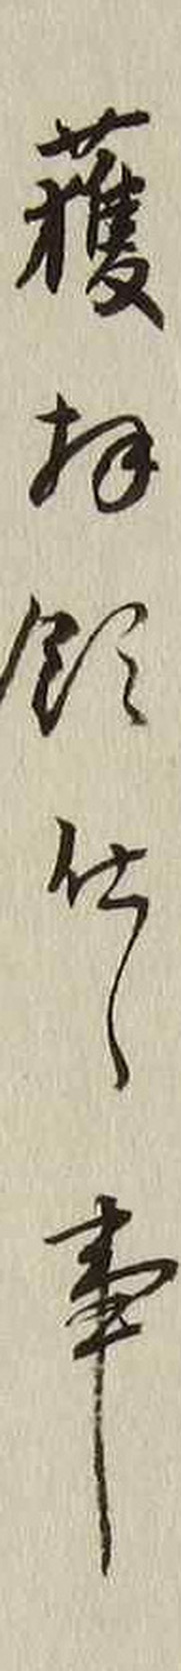獲物領仕り候事
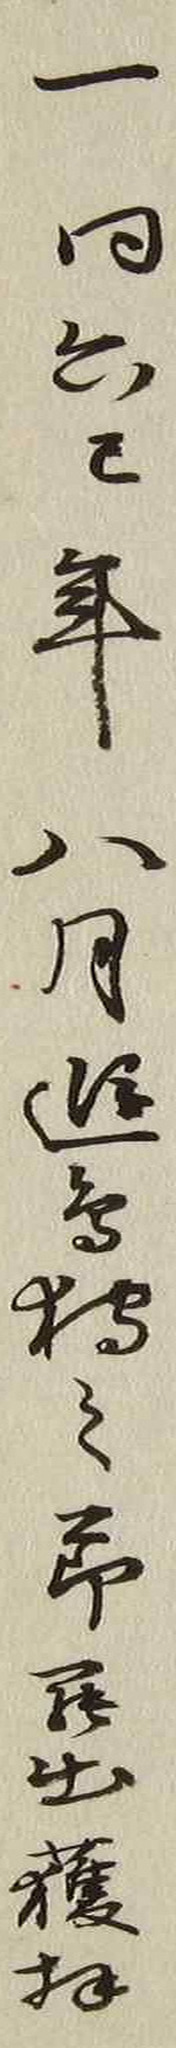一同六巳年八月追鳥狩之節罷り出で獲物
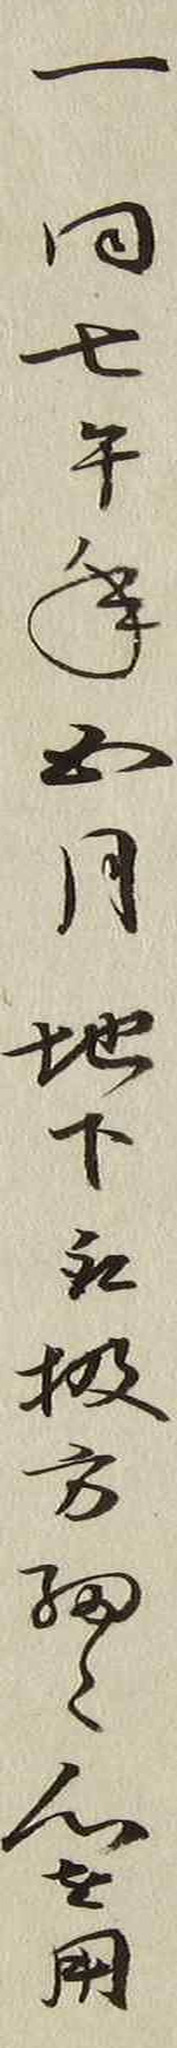一同七午年五月地下取扱い方細々心を用い
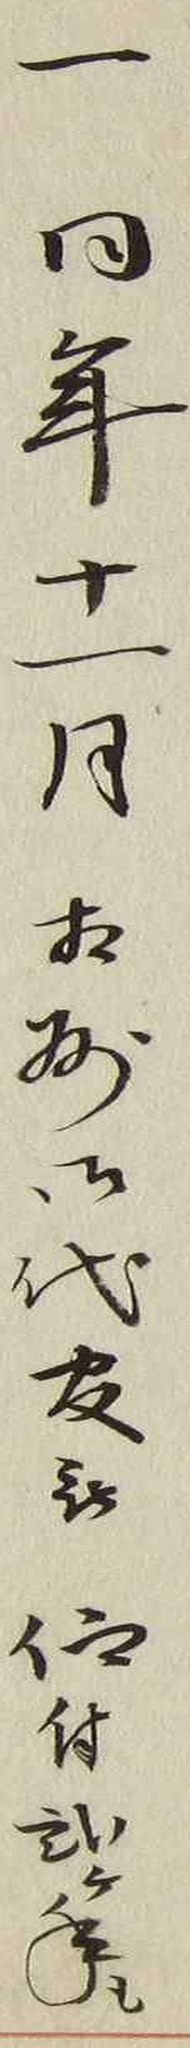一同年十一月相州御代官仰せ付けられ弐ケ年も

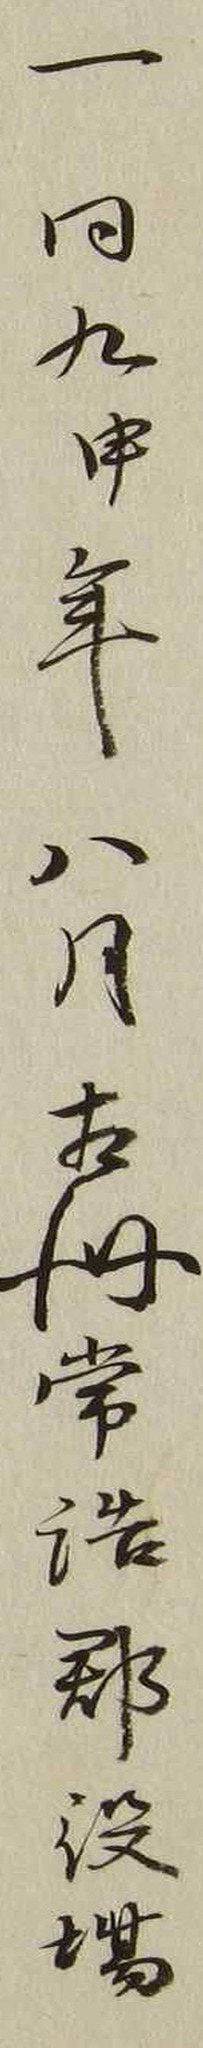一同九申年八月相州常詰郡役場
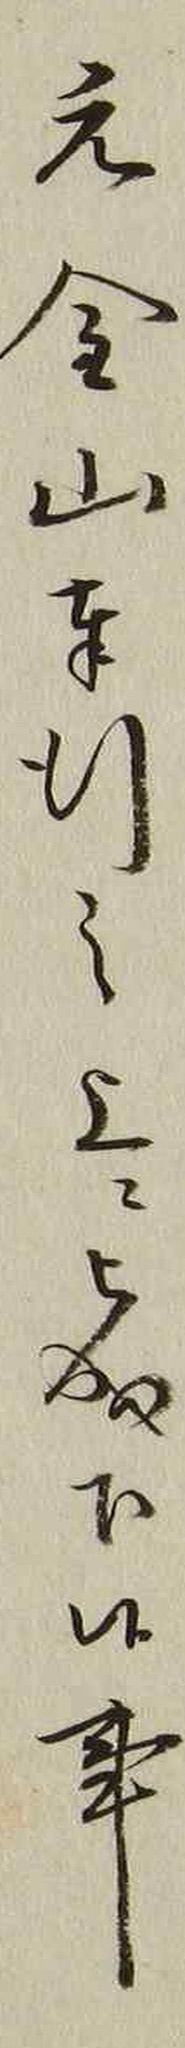元金山奉行之上ニ成し下され候事
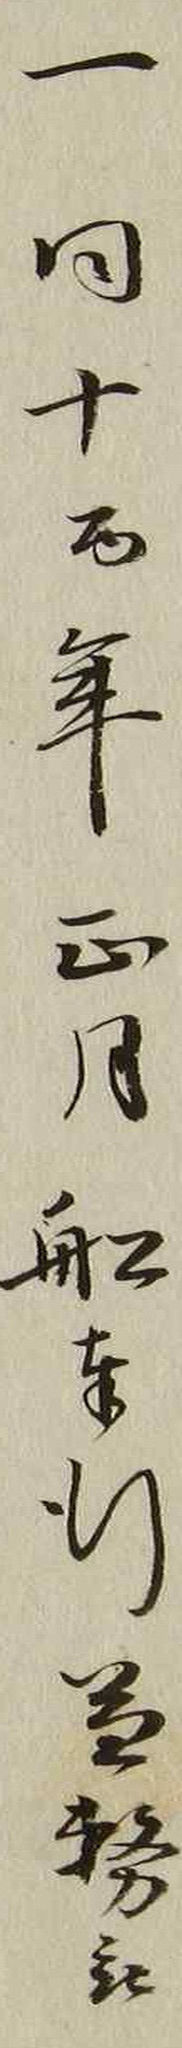一同十酉年正月船奉行兼務
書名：諸士系譜　巻之16　い之部16
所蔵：会津若松市立会津図書館
